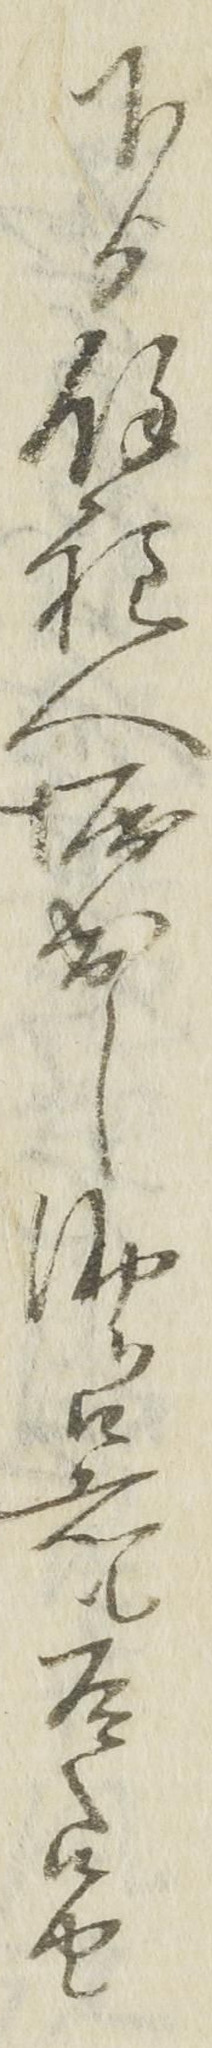下ゟ余程人掘出し助り候者も有之候由
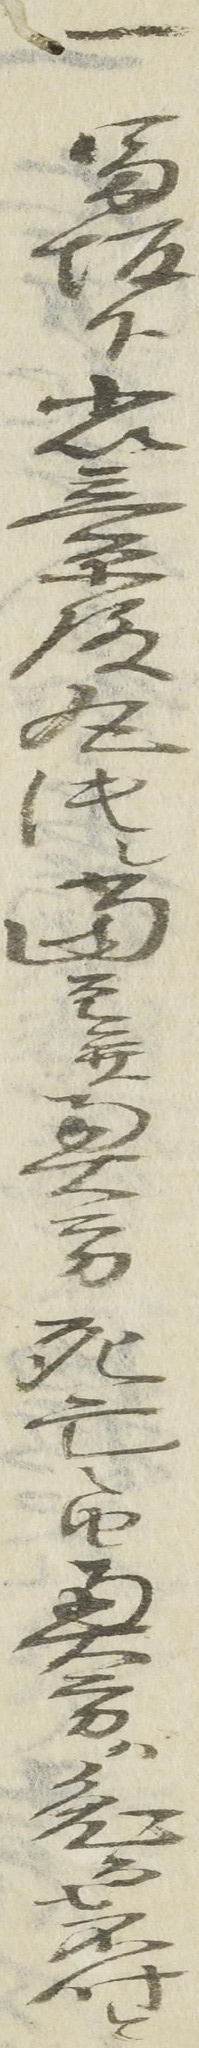一冨坂下小笠原殿丸潰レ当主幷奥方死亡之由奥方ハ勉而も不叶と
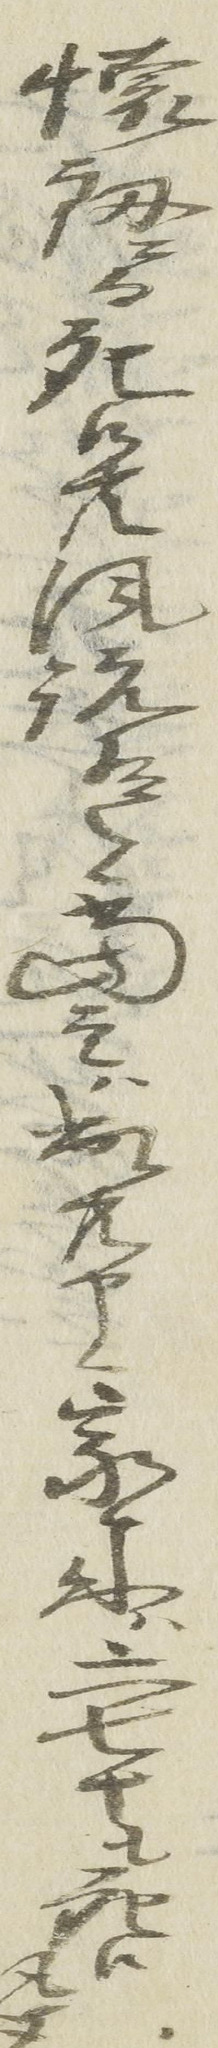懐剣ニ而死候共風説有之候当主ハ出候共申候家来ハ六七十も死候風聞
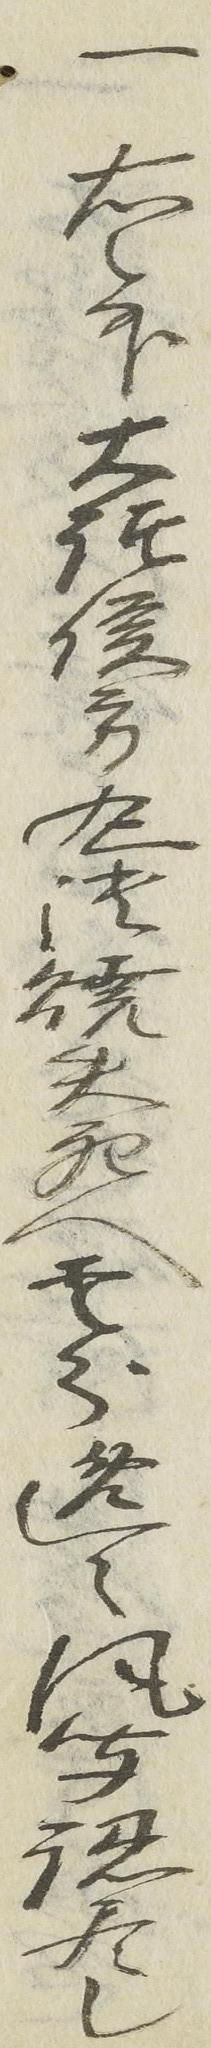一右之外大祗候方丸潰焼失死人処分逸々風聞認尽し
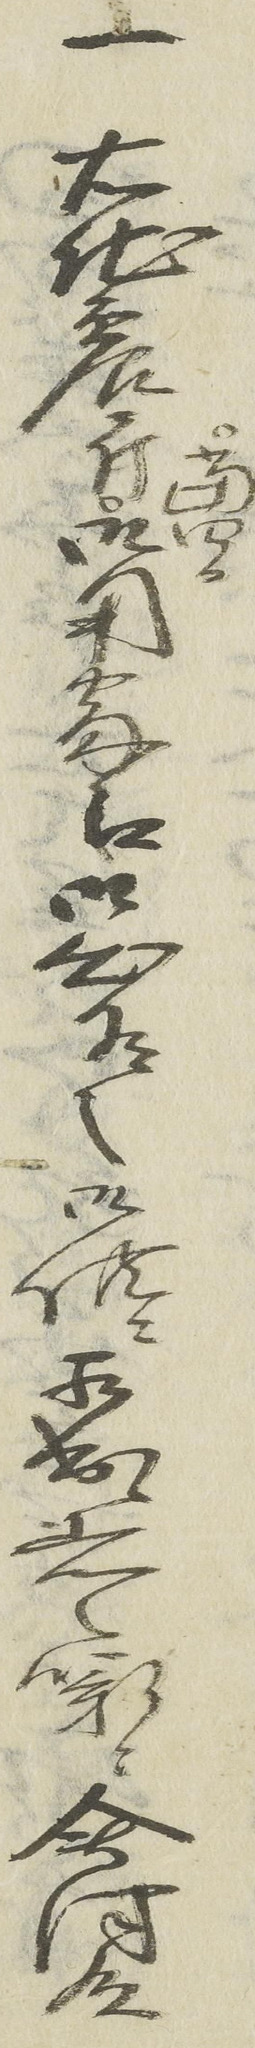一右地震ニ付御用番江御出有之御供ニ相出候者之噺ニ会津殿

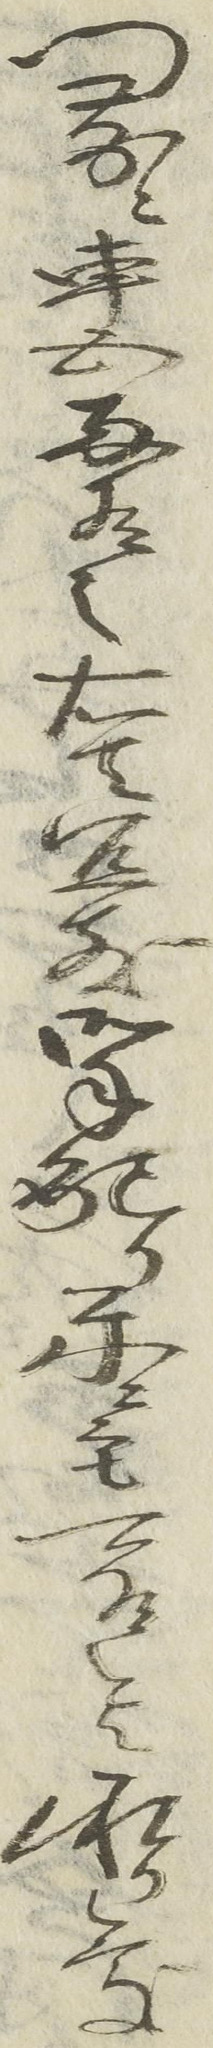門前に車五両有之右は宜敷御手配り米ニても可有之と承り候処
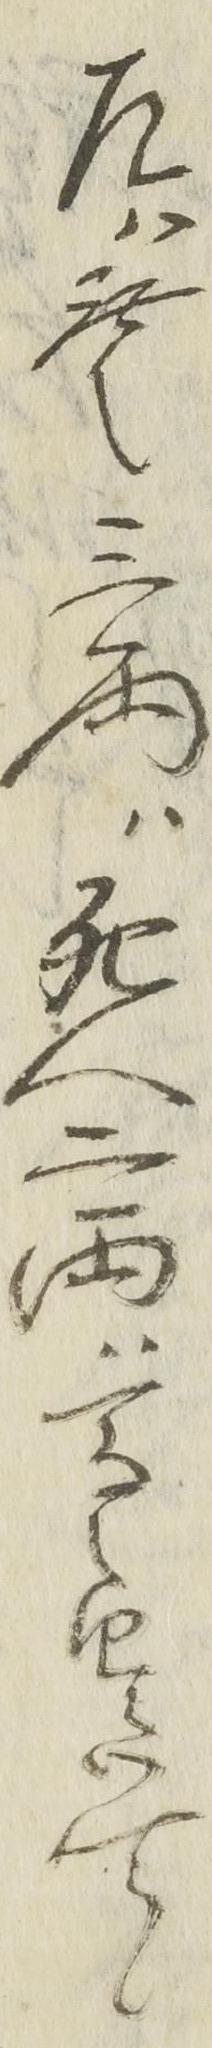左ハ無之三両ハ死人二両ハ馬之由ニ御座候
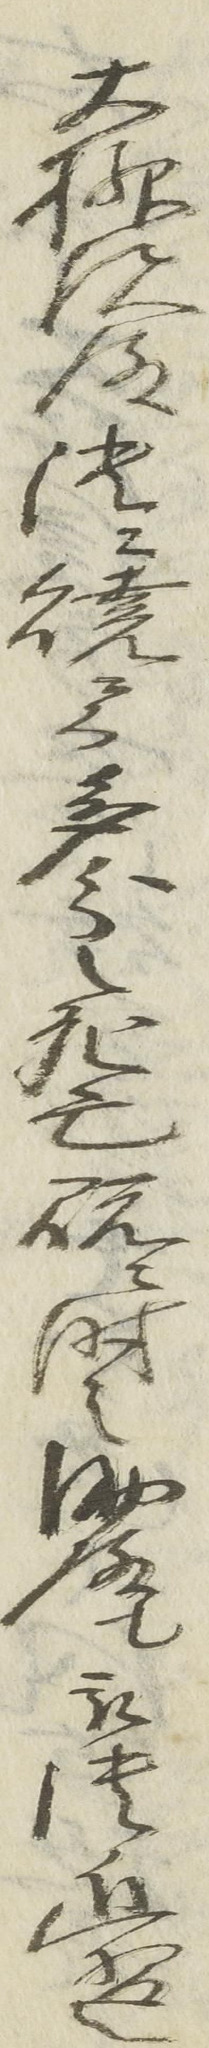一大炊頭殿潰ニ焼ニ而多分之死亡既ニ時之助殿も被潰近習之
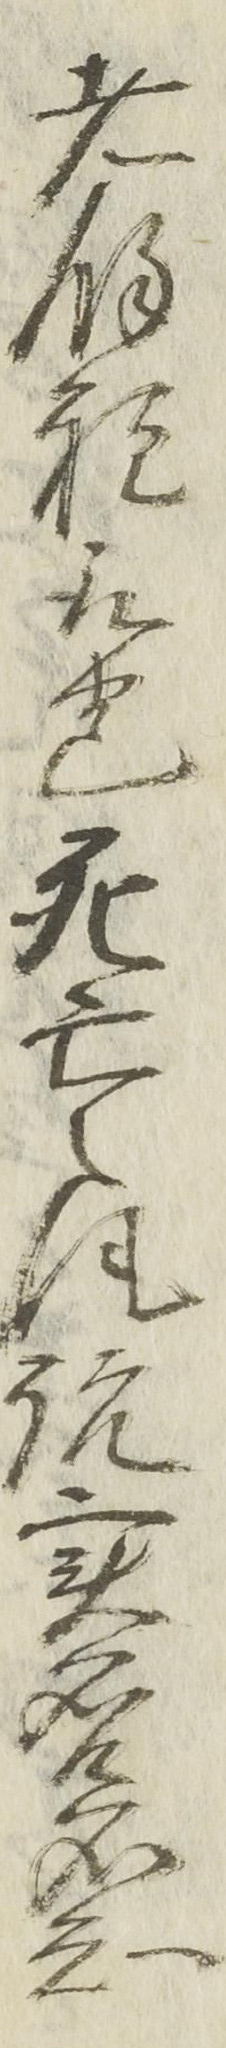者余程取包死亡之風説実否不知
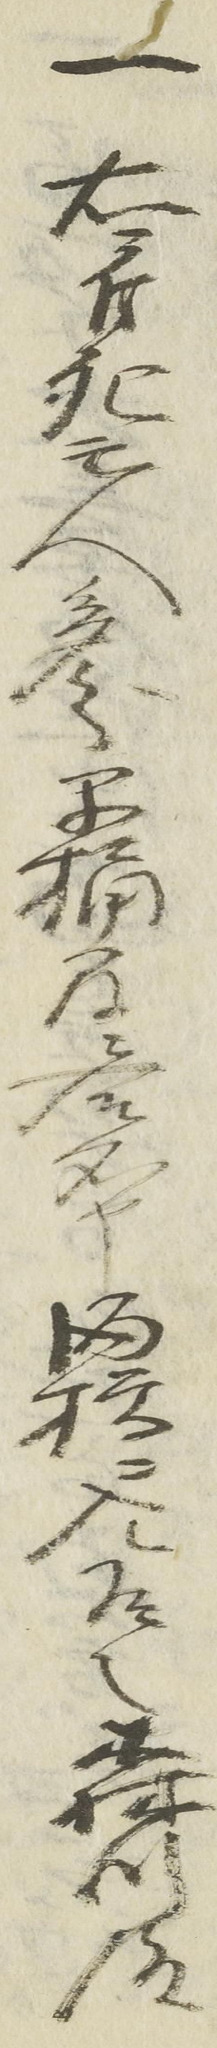一右ニ付死亡人多分早桶間ニ合不申酒樽ニ入レ有之森川殿
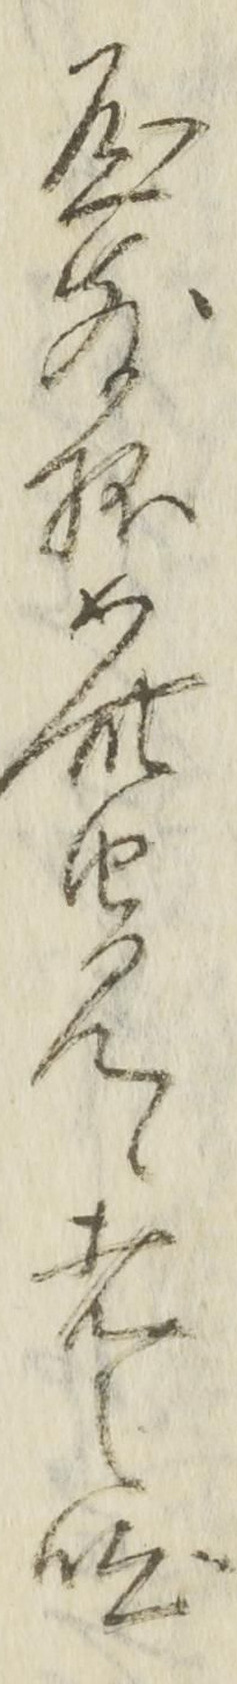屋敷抔如此由見候者之咄
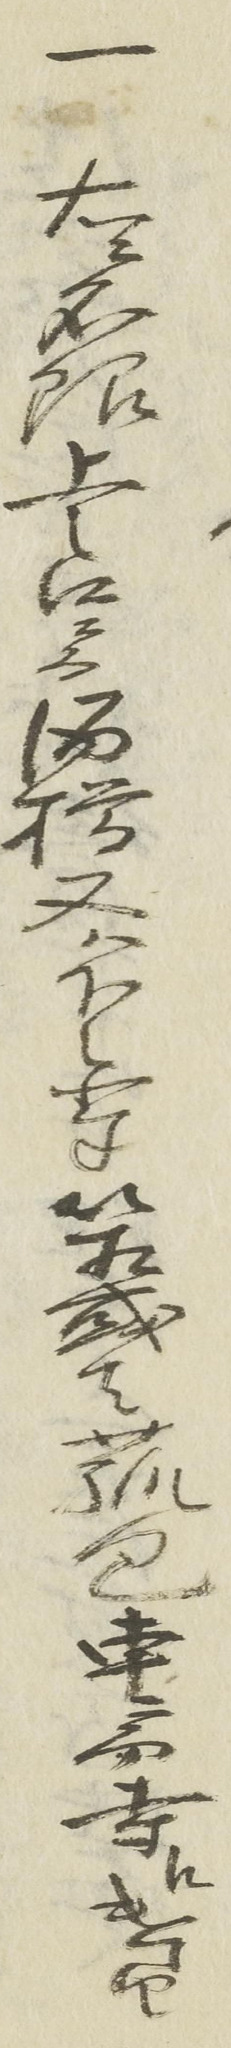一右ニ不限上之口ニ而酒樽又ハ下之輩箱或は菰包車ニ而寺江遣候由
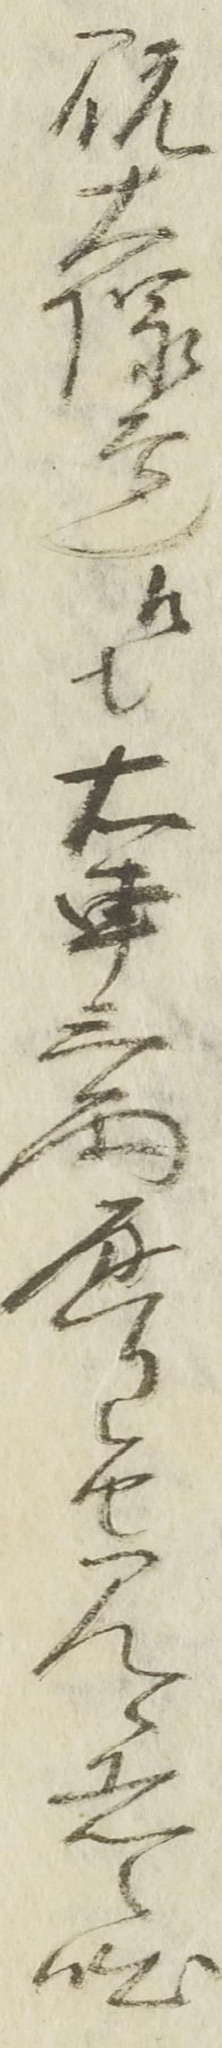既大塚辺江も右車三両通り候由見候者之咄
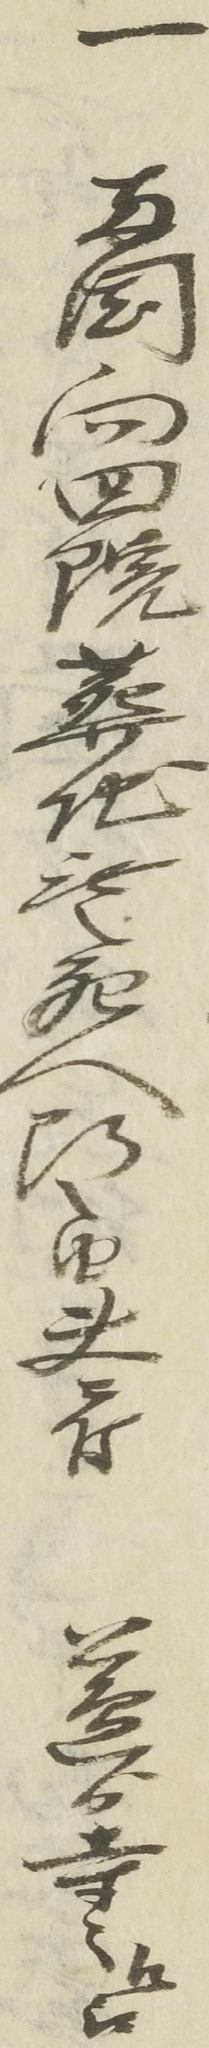一両国向回院葬地無之死人断候由夫ニ付公辺ゟ寺〻江被
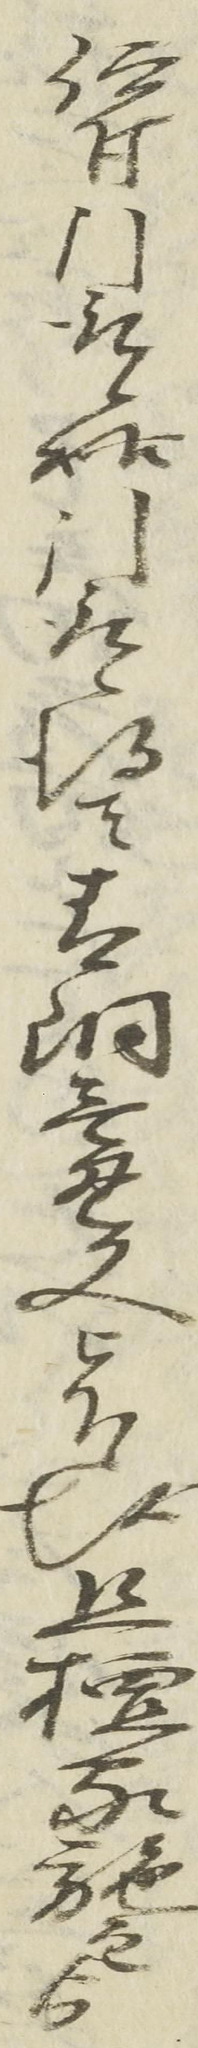仰付引取候様引取候得は青銅一貫文被下候趣且檀家施主ゟ
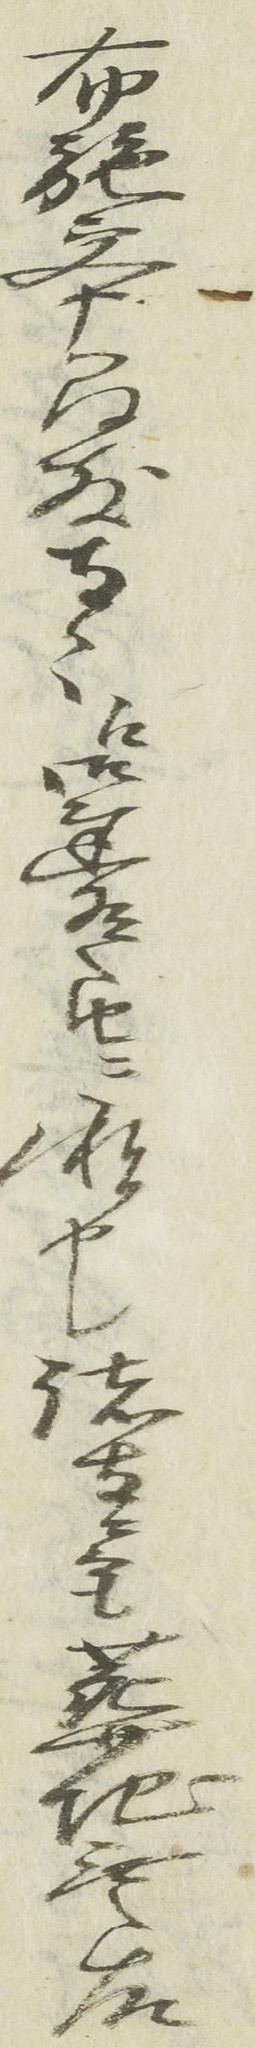布施受申間敷寺〻江御達有之由ニ承申候諸寺ニても葬地無之故
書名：安政乙卯江戸大地震筆記　安政丙辰八月大阪大雷雨之記追加　安政三辰年七月松前辺大地震并八月大風雨記録
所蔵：東京大学地震研究所図書室 Earthquake Research Institute Library, The University of Tokyo, JAPAN
